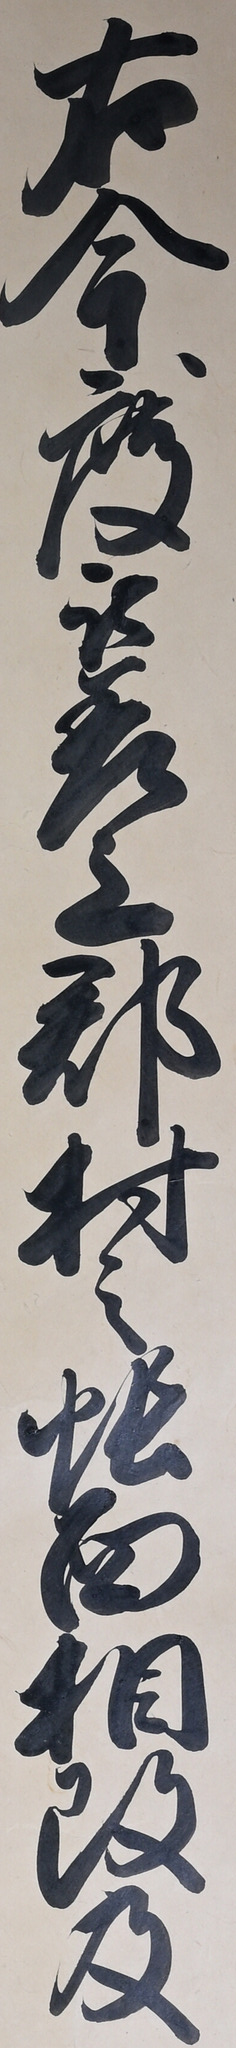右今度被差上郡村之帳面相改及
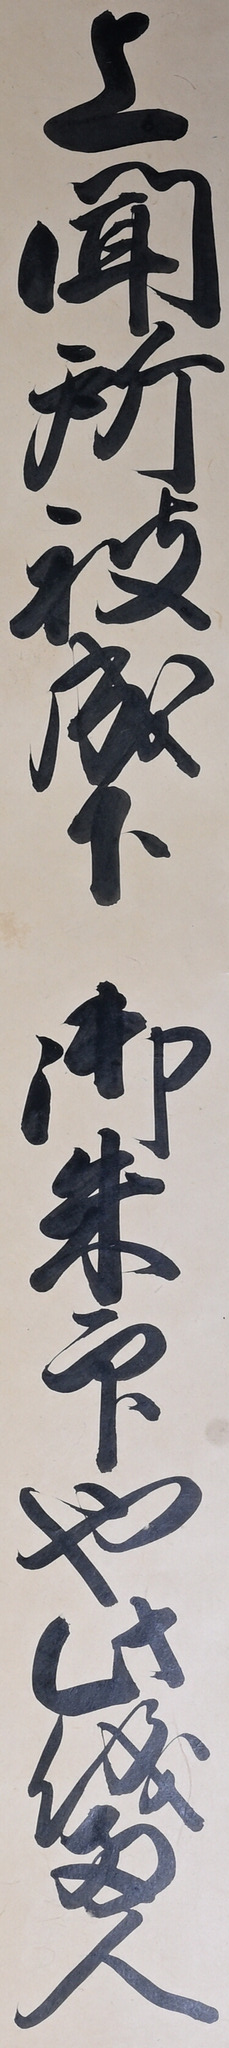上聞所被成下御朱印也此儀両人
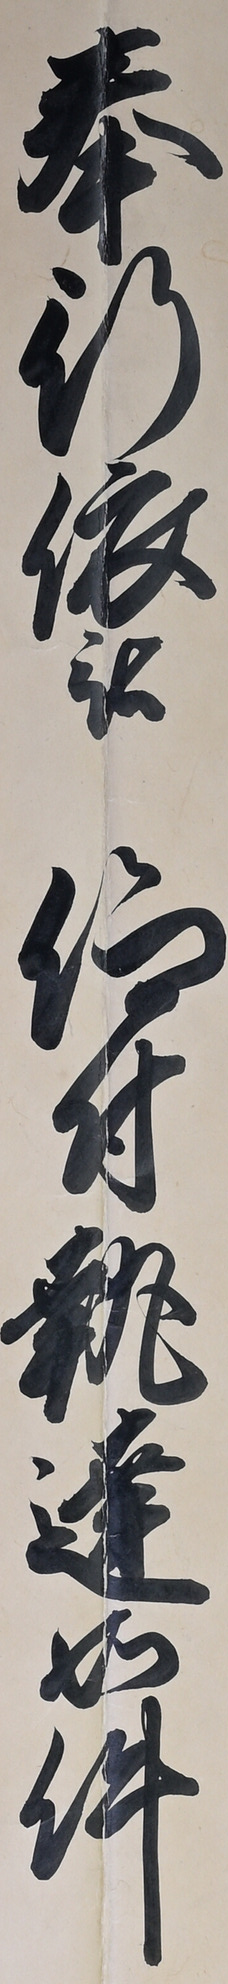奉行依被仰付執達如件
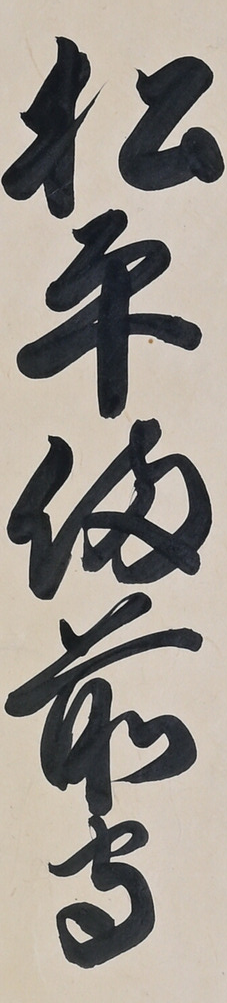松平備前守
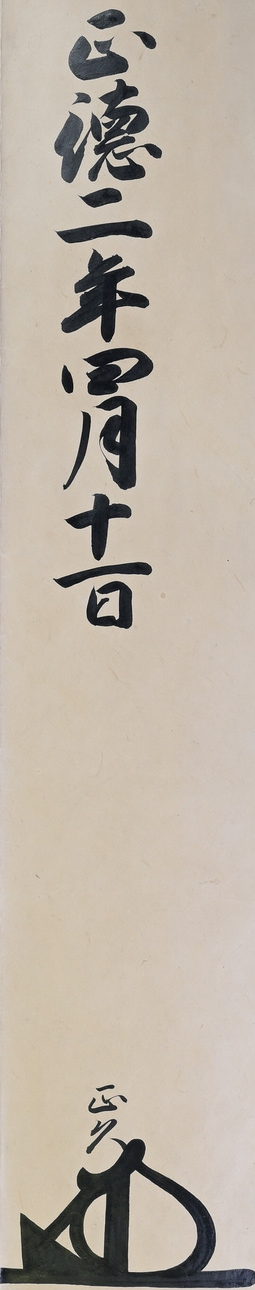正徳二年四月十一日正久
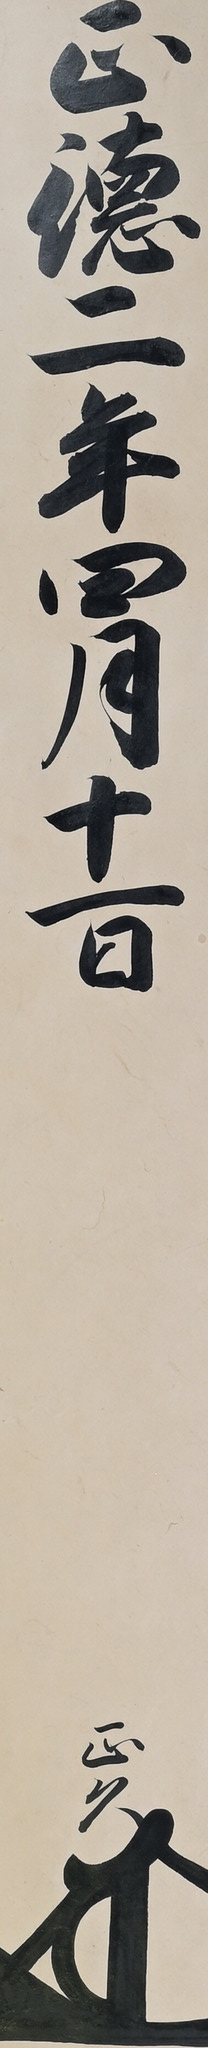正徳二年四月十一日正久
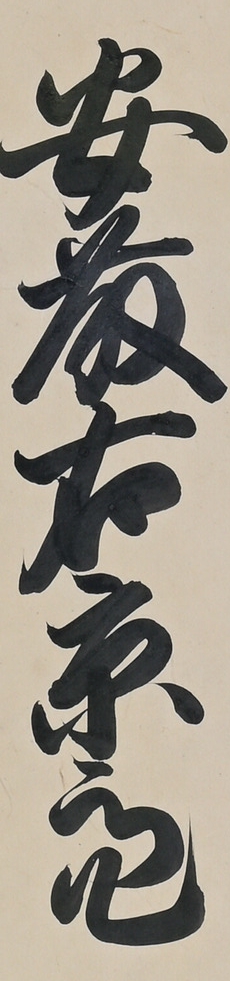安藤右京亮
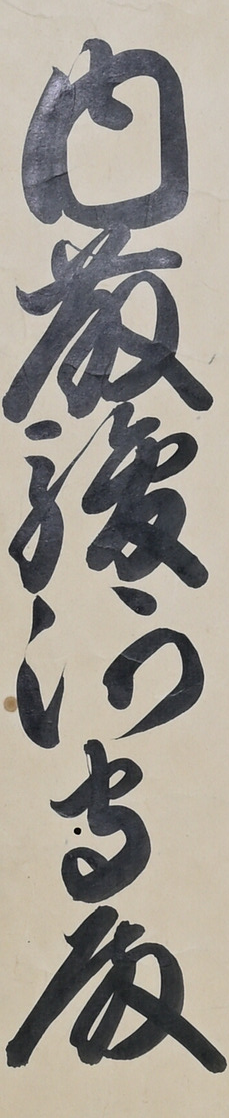内藤駿河守殿
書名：御領地目録
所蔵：伊那市立高遠町図書館・合同会社AMANE
